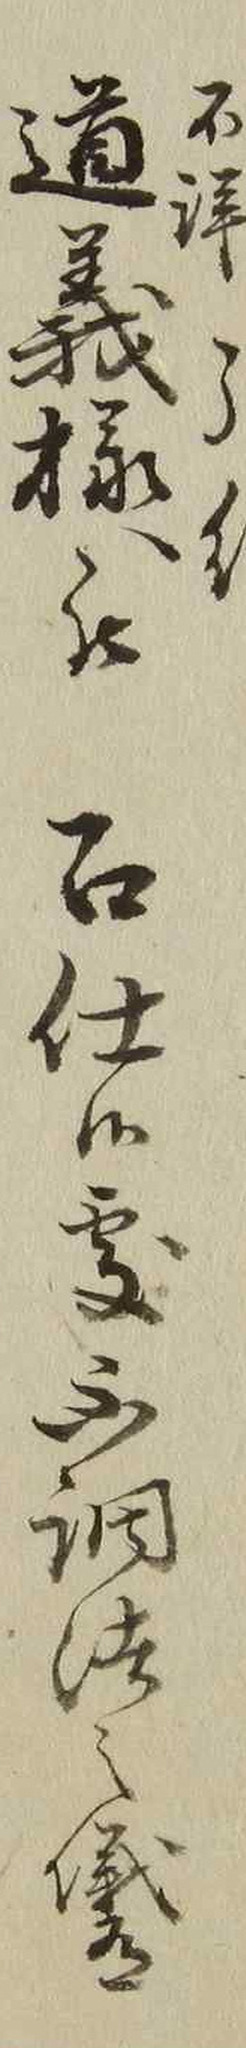道義様へ被召仕候処不調法之儀有
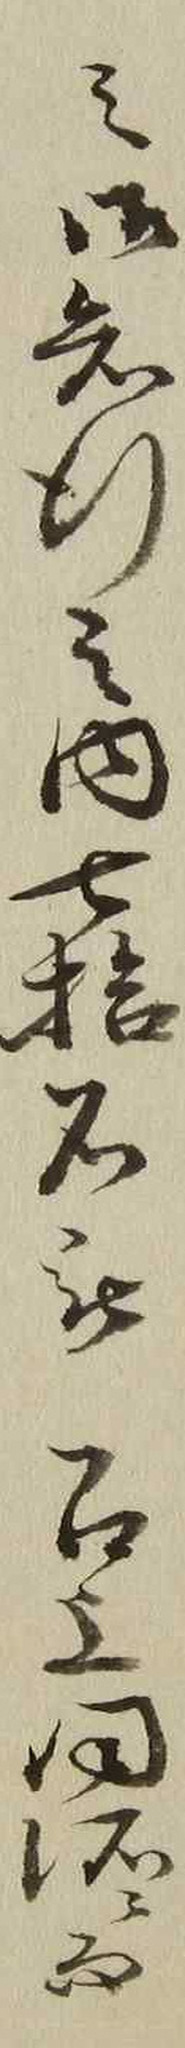之御知行之内七拾石被召上同所ニ而
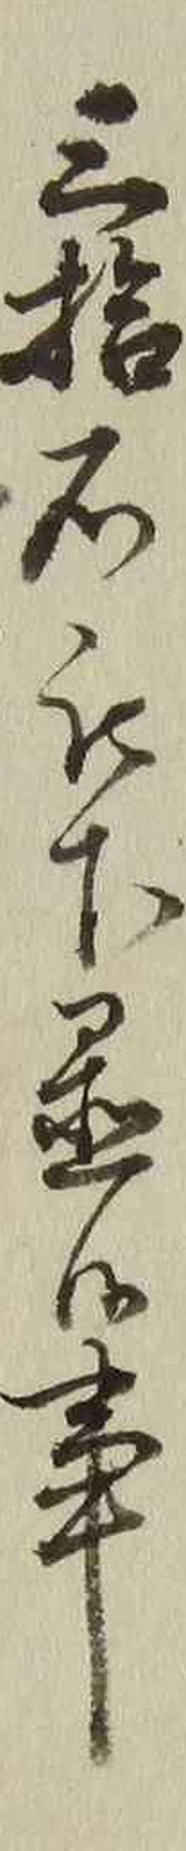三拾石被下置候事
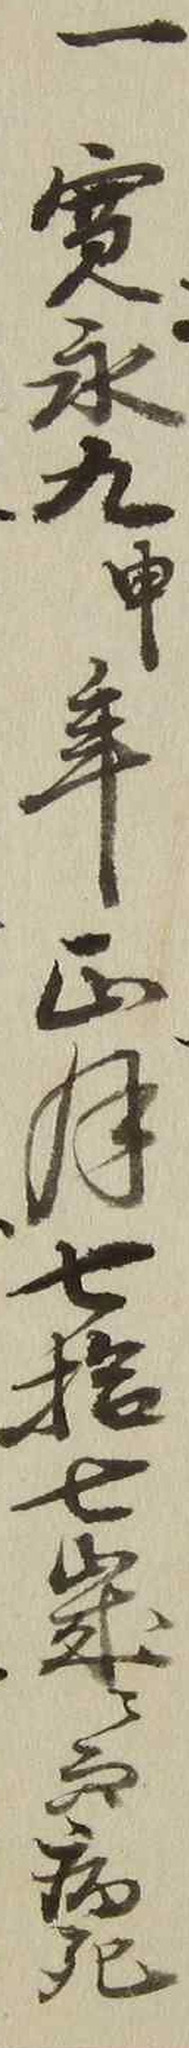一寛永九申年正月七拾七歳ニ而病死
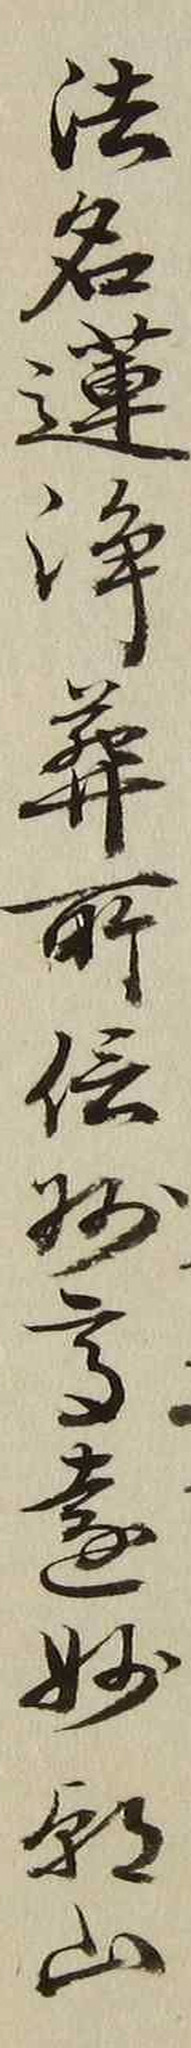法名蓮浄葬所信州高遠妙朝山
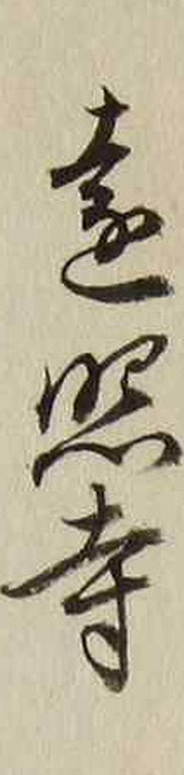遠照寺
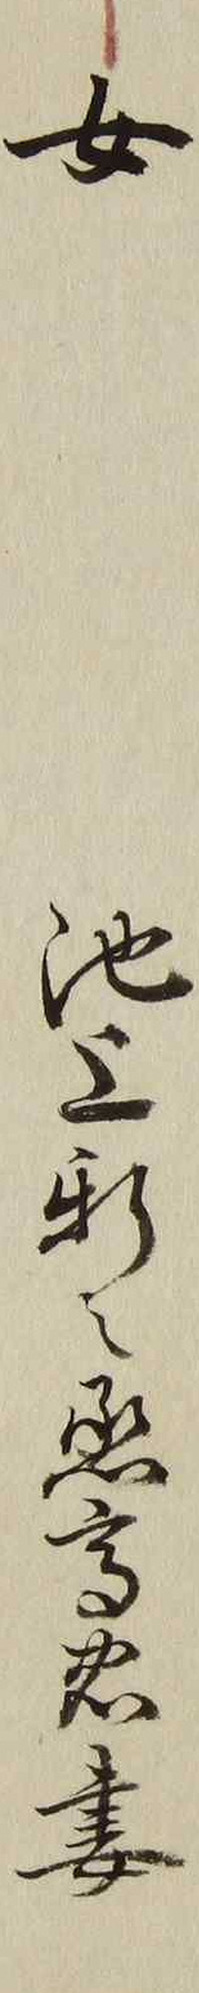女池上新之丞高忠妻
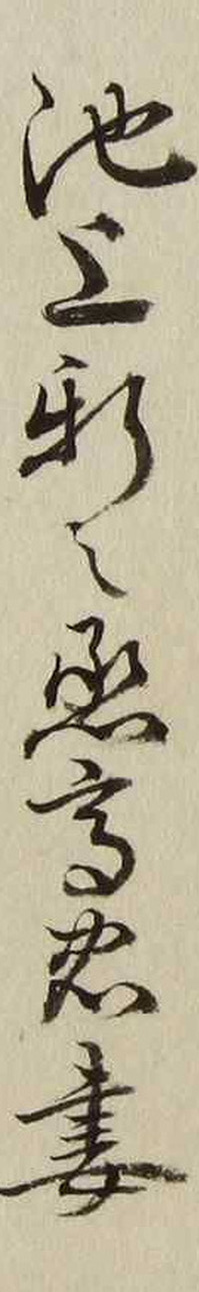女池上新之丞高忠妻
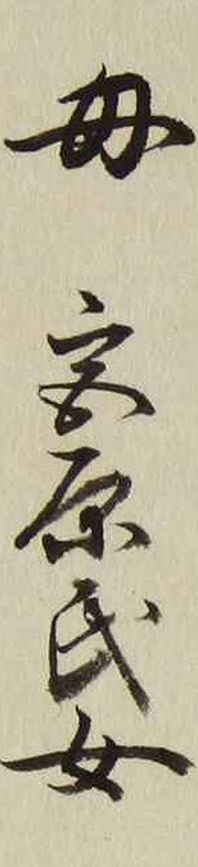母宮原氏女

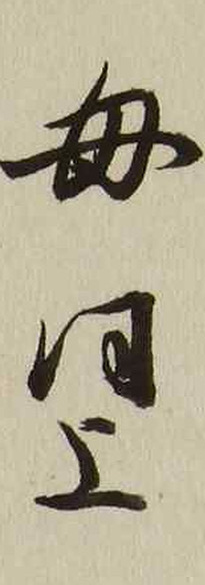母同上
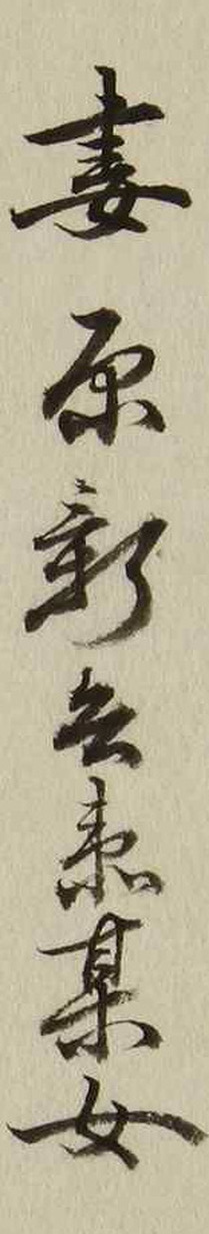妻原新兵衛某女
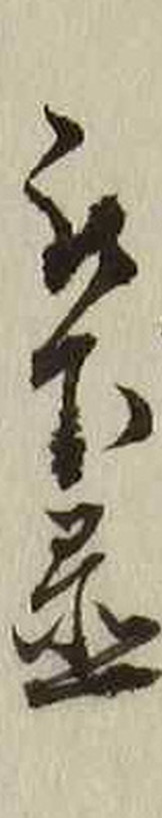被下置
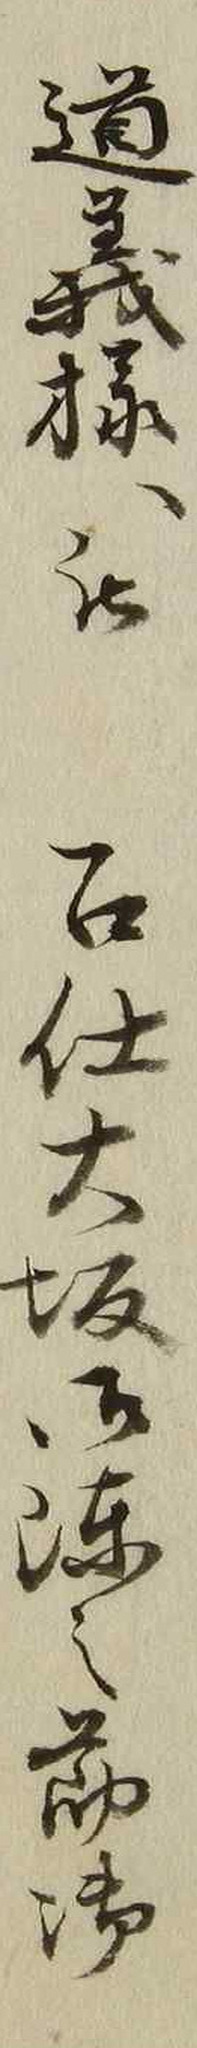道義様へ被召仕大坂御陳之節御
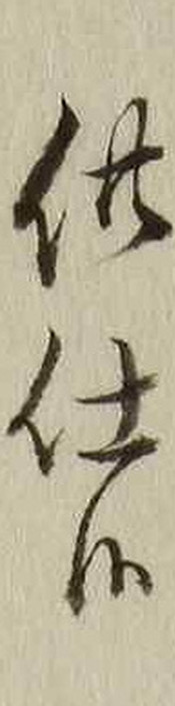供仕候
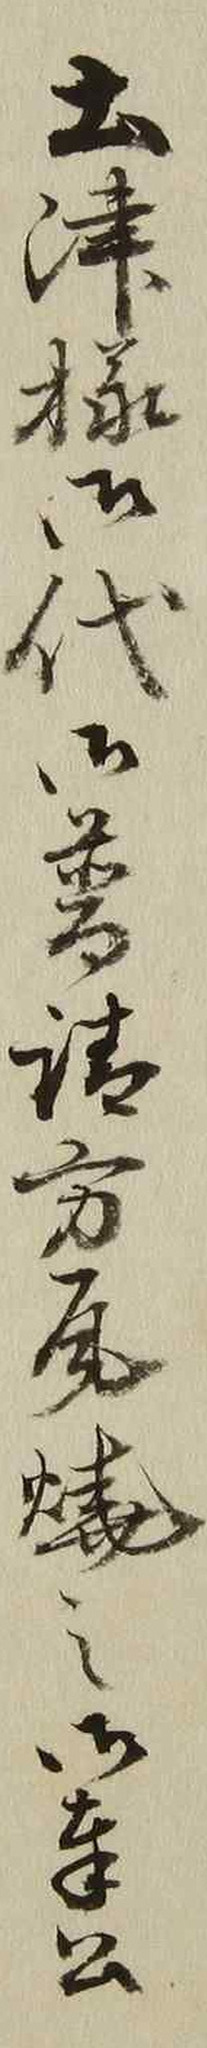土津様御代御普請方瓦焼之御奉公
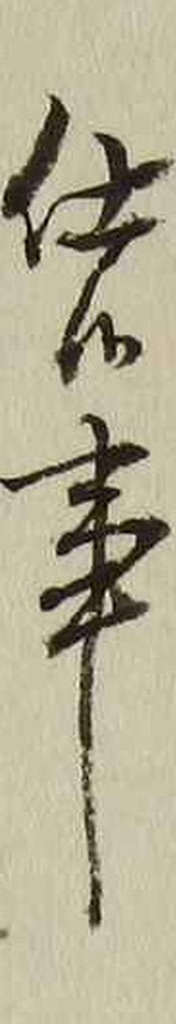仕候事
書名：諸士系譜　巻之36　は之部4
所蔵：会津若松市立会津図書館
